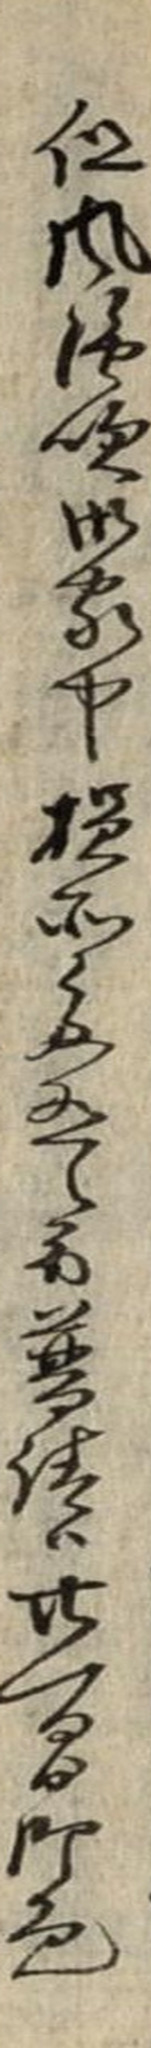但風強吹御家中損所多有之候て普請は廿一日ゟ御免
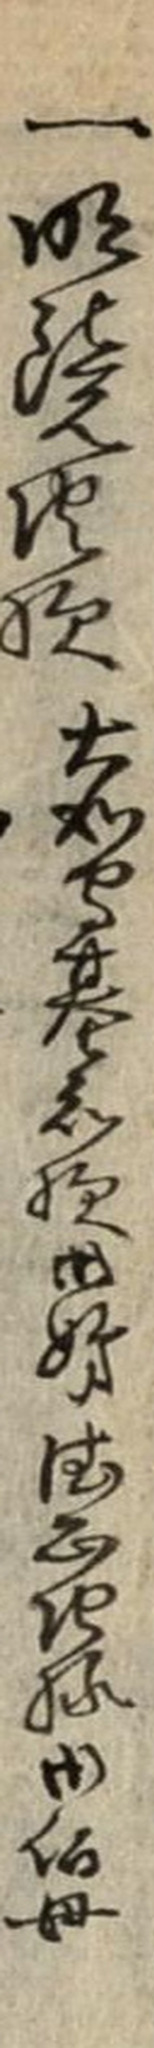一明鏡院様大和守基知様御姉徳正院様御伯母
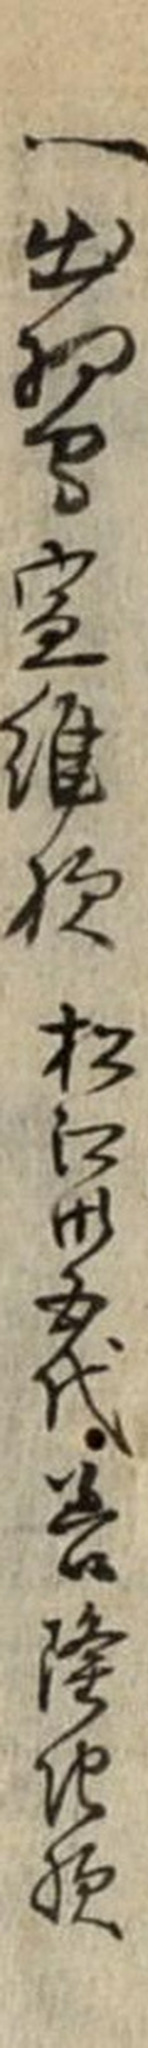一出羽守宣維様松江御五代善隆院様
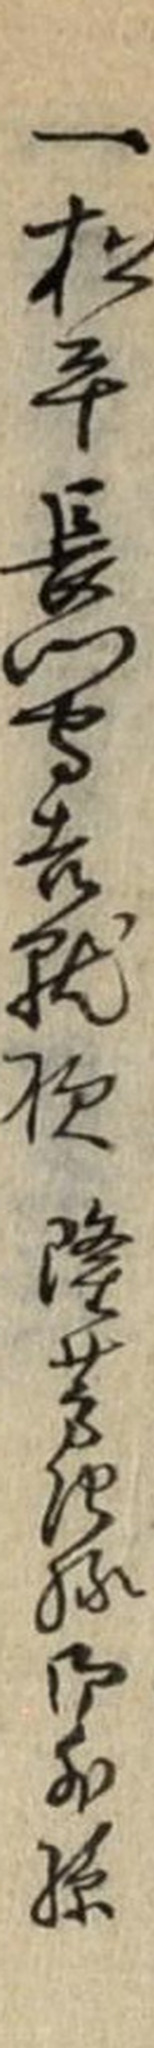一松平長門守吉就様隆芳院様御外孫
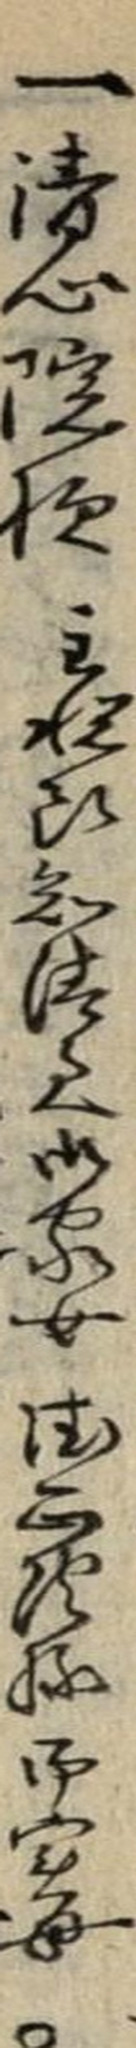一清心院様主税頭知清君御家女徳正院様御実母
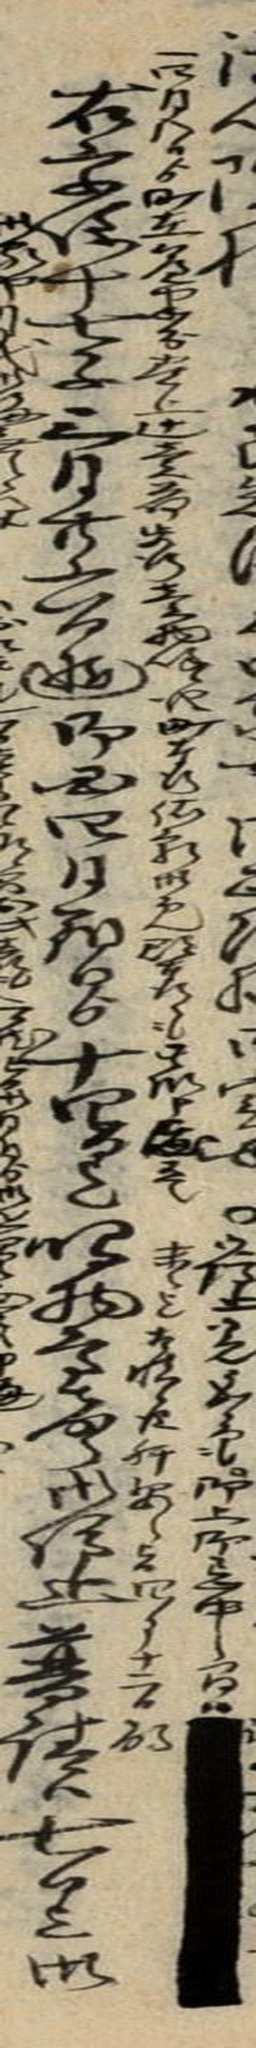右享保十七子三月廿六日逝御国四月朔日ゟ十四日迄鳴物高声御停止普請は七日迄御
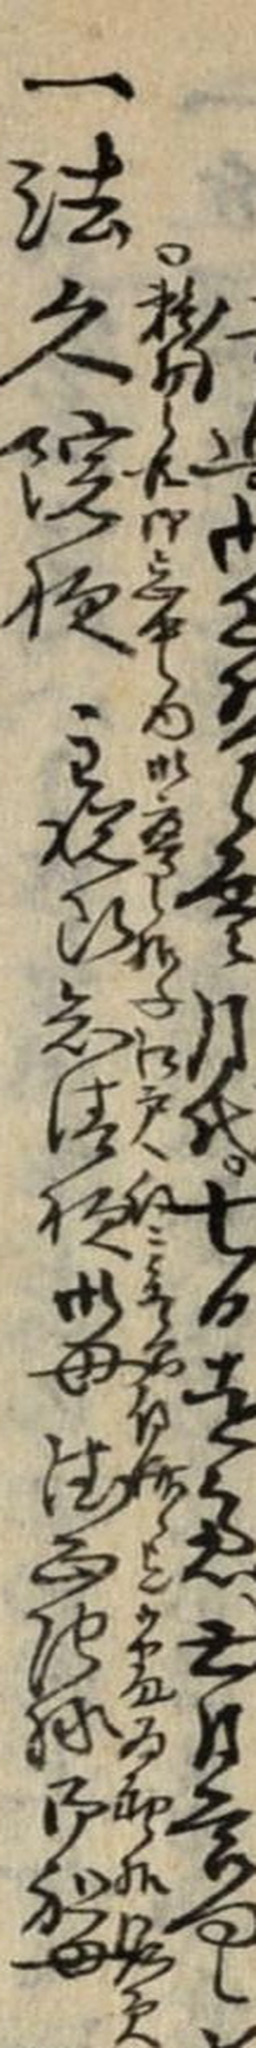一法久院様主税頭知清様御母徳正院様御祖母
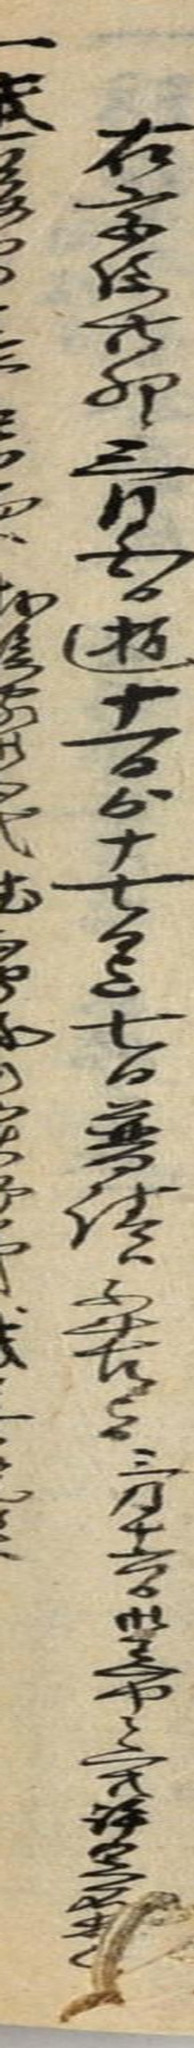右享保廿卯三月五日逝十一日ゟ十七日迄七日普請は不苦旨三月十六日御忌中に候へ共評定不相止
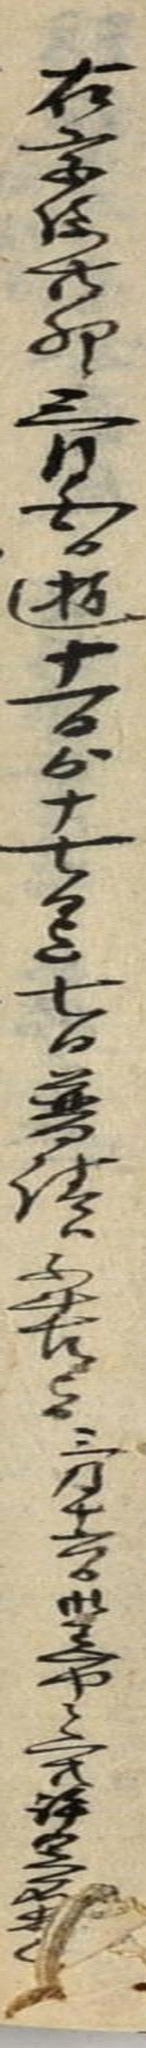右享保廿卯三月五日逝十一日ゟ十七日迄七日普請は不苦旨三月十六日御忌中に候へ共評定不相止
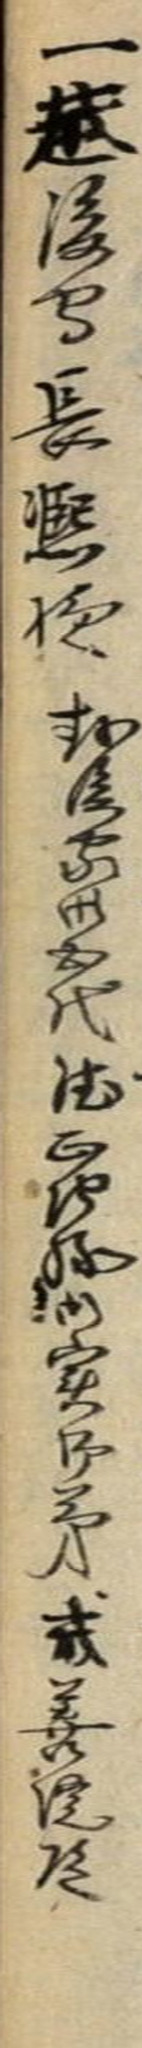一越後守長凞様越後家御五代徳正院様御実御弟戒善院殿
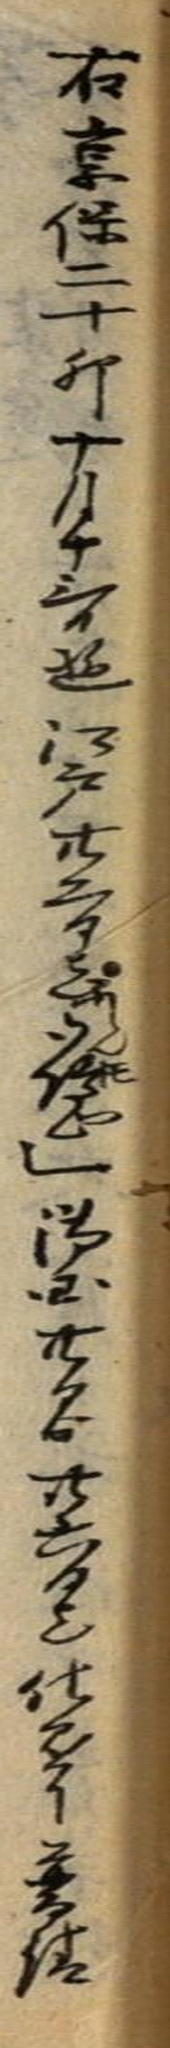右享保二十卯十月十三日逝江戸廿二日迄御停止」御国廿日ゟ廿六日迄仕懸り普請
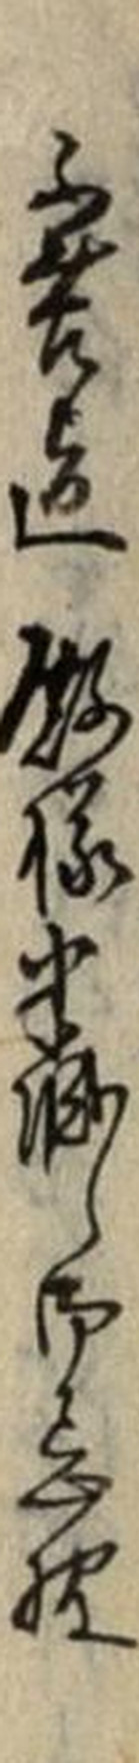不苦旨」殿様半減之御忌服
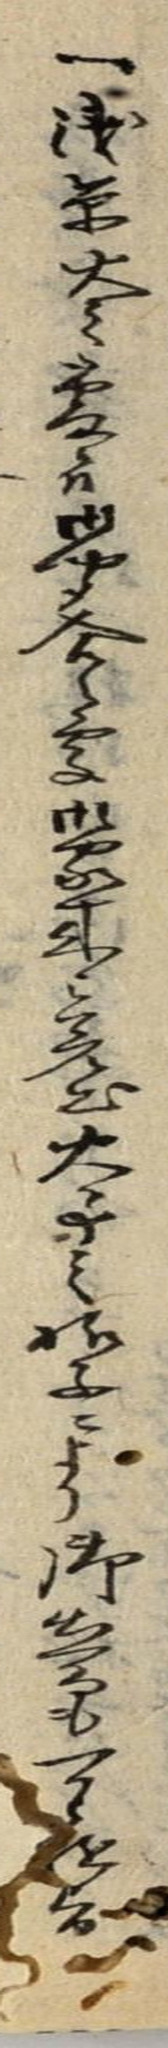一浅草火之御番に付御聞合候処御家来被差出火事之様子により御出馬も可被遊旨
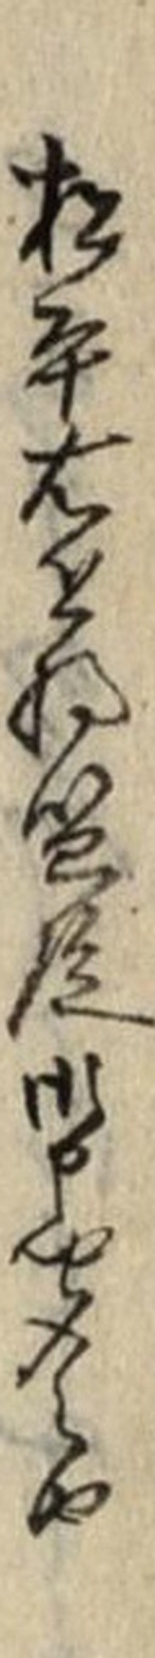松平右近将監殿御申聞候由
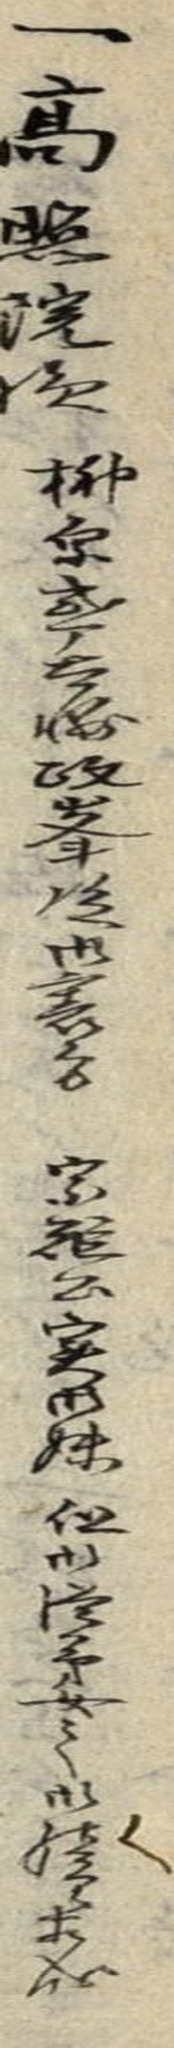一高照院様榊原式部太輔政峯殿御裏方宗矩公実御妹但御従弟女之御続に相成
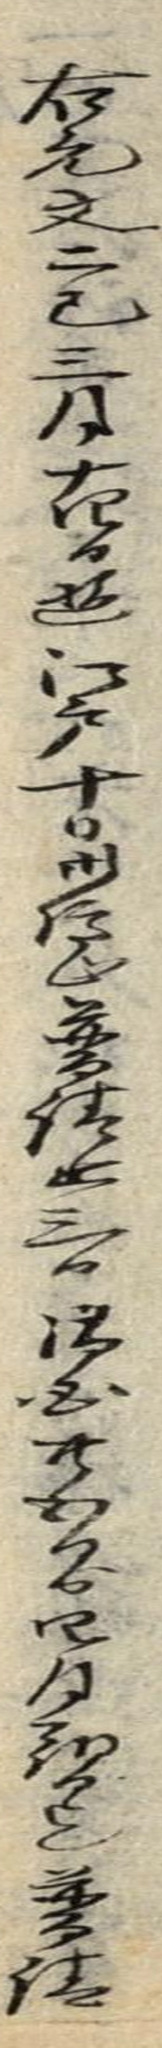右元文二巳三月十四日逝江戸十日御停止普請止三日御国廿五日ゟ四月朔日迄普請
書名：御停止異変死失
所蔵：福井県文書館 Fukui Prefectural Archives
